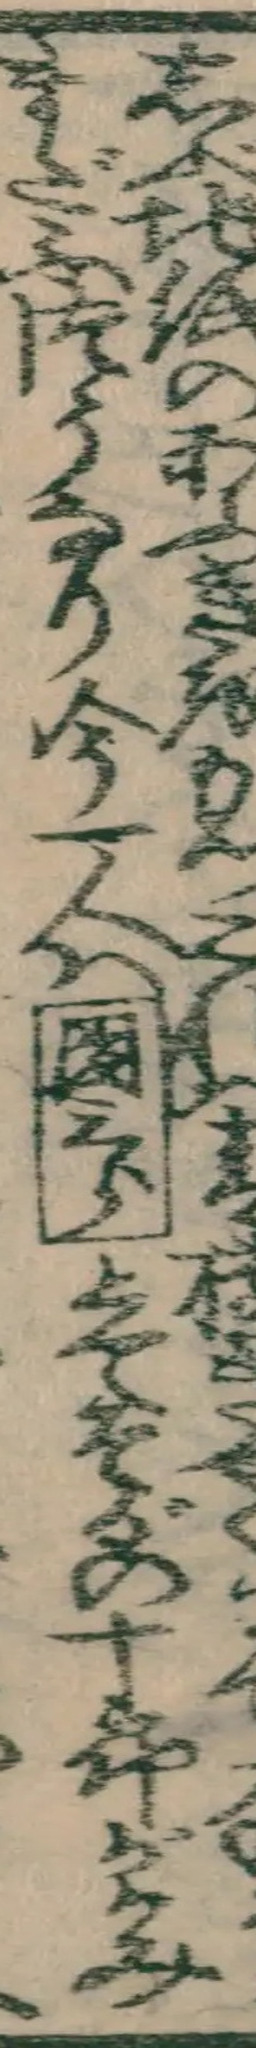まだふつうなり今一人は〈団三郎〉とてそがの十郎がかみ
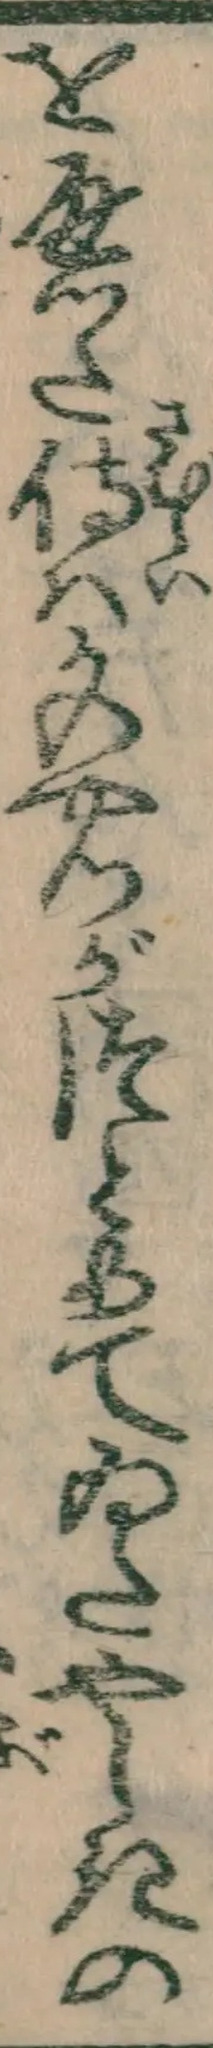を通つた侍はかのやつがつとめてゐたやしきの
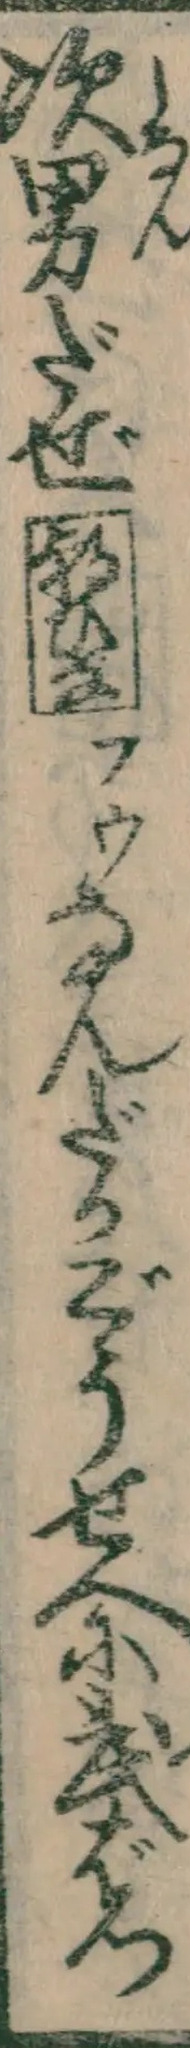次男だぜ〈朝ひな〉フウなんだかごうせへに武ばつ
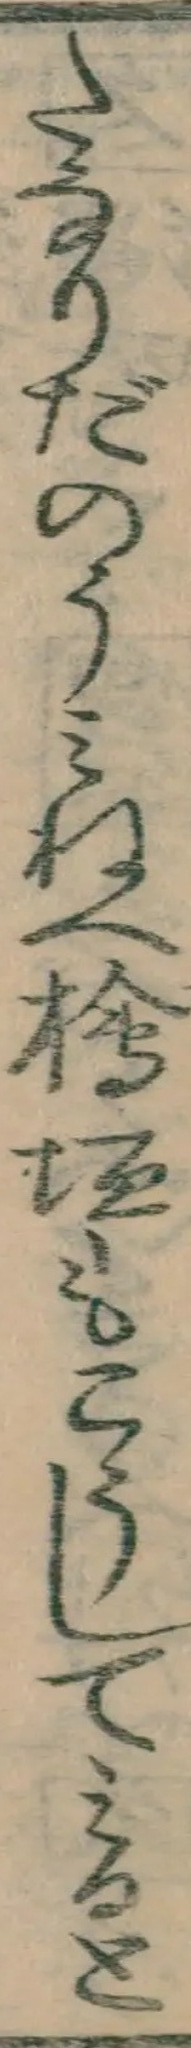たなりだのうみねへ檜垣もこうしてみると
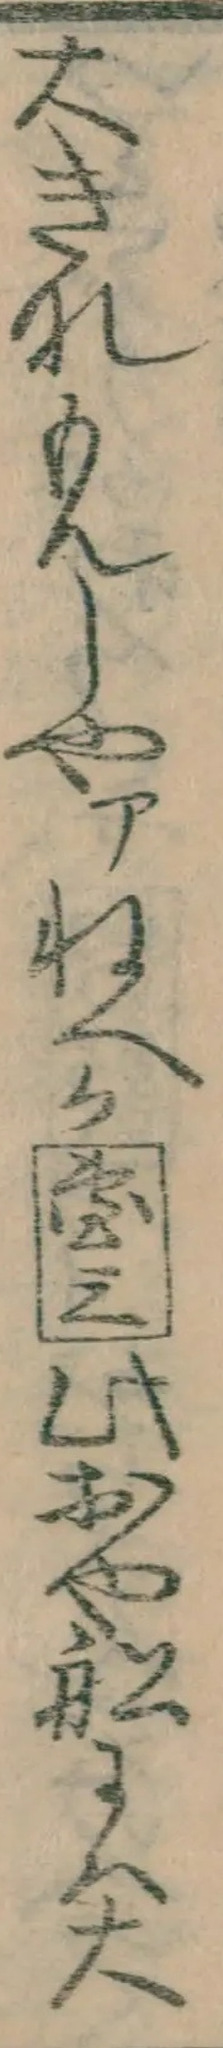大きなもんしやァねへか〈団三〉此おや船には大
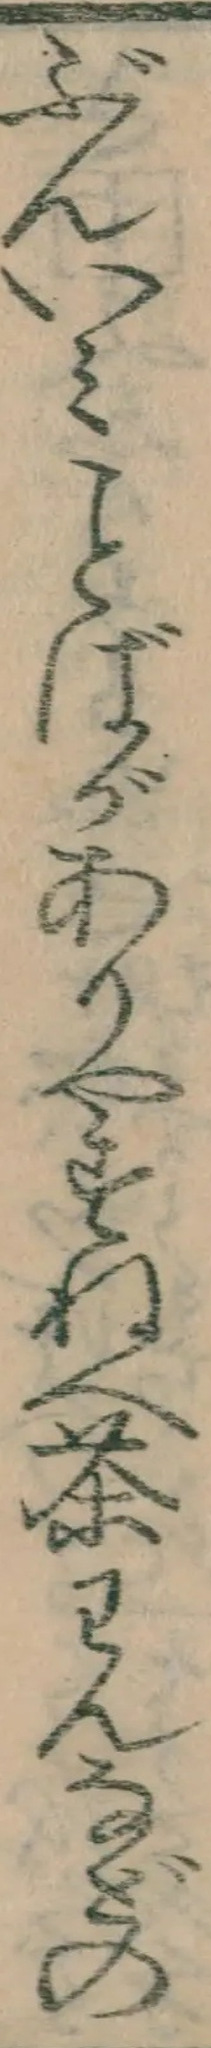ぶんいみことばがありやすねへ茶わんなどの
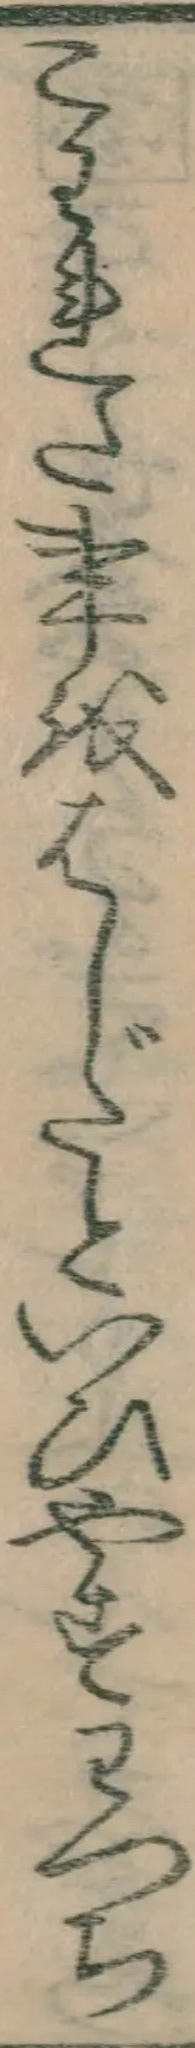こわれた事をはじたといひやすわつち
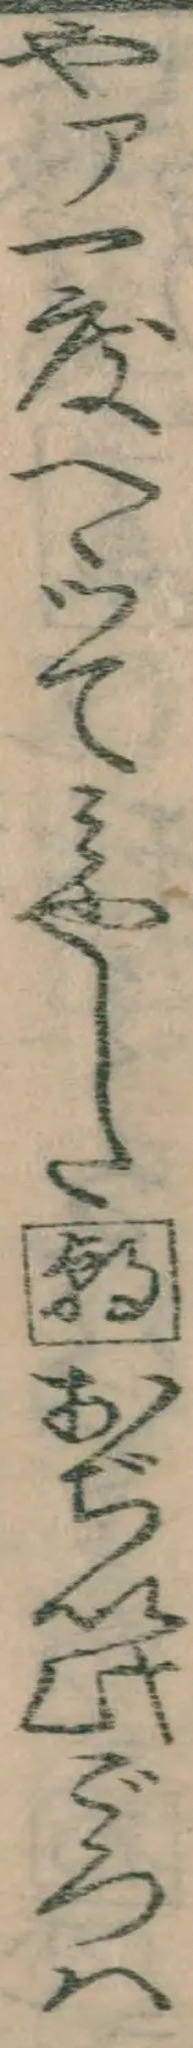やア一度へゝつてみやした〈朝〉おぢい此ごろは
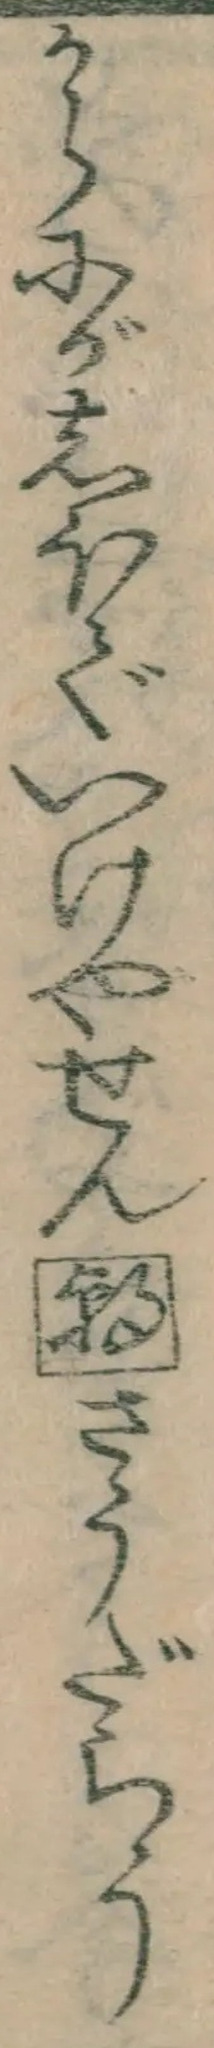からにがしほでいけやせん〈朝〉さうだらう
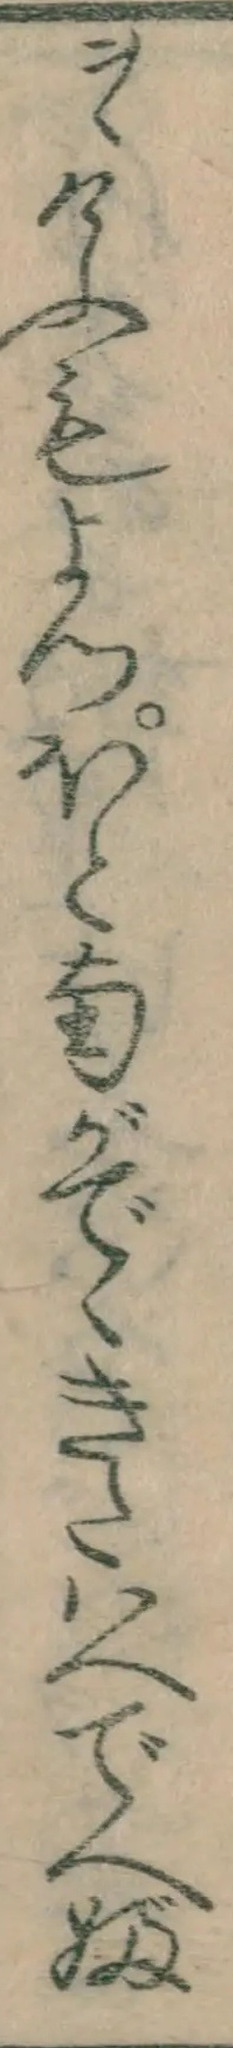ヲヽけふもよつぽとな南？がでゝきたはへでへぶ

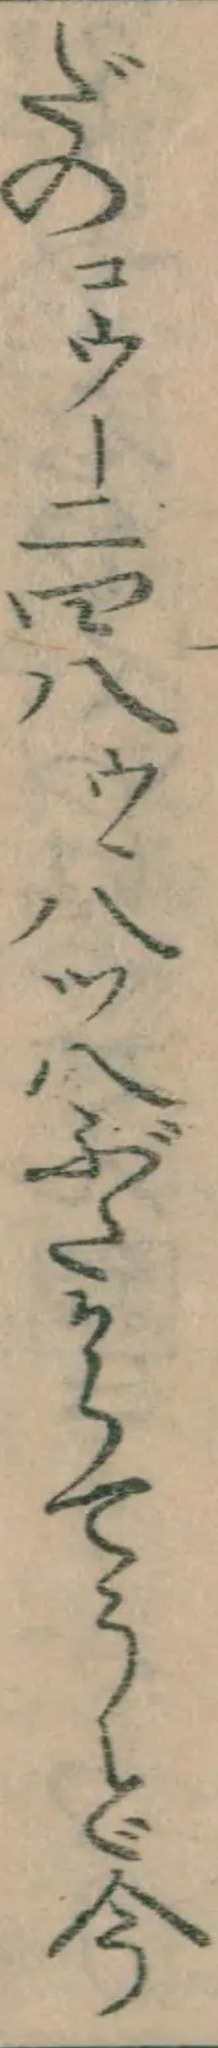だのコウー二四八ウヽ八ツ八ぶたからてうど今
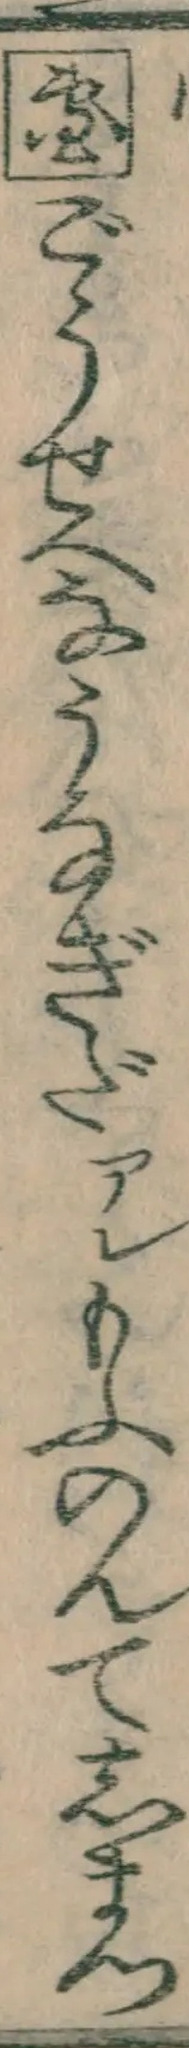〈団〉ごうせへなぎだアレもふのんてしまつ
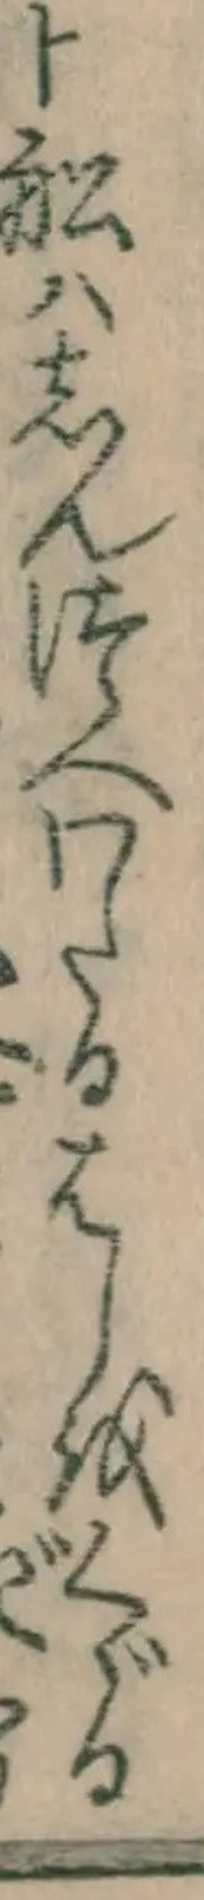ト船はしんつへわたるはしをくゞる
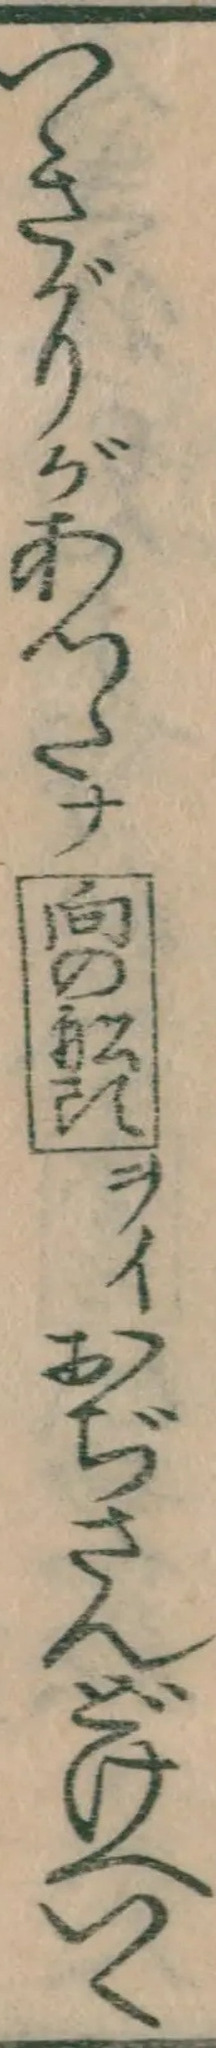いきがりがあつたナ〈向の船頭〉ヲイおぢさんどけへいく
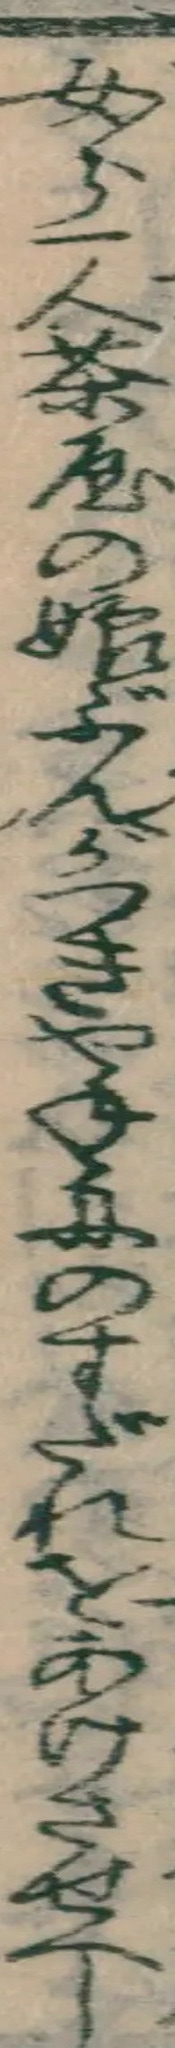女郎一人茶屋の娘ぶんがつきや手舟のすだれをあけさせへし
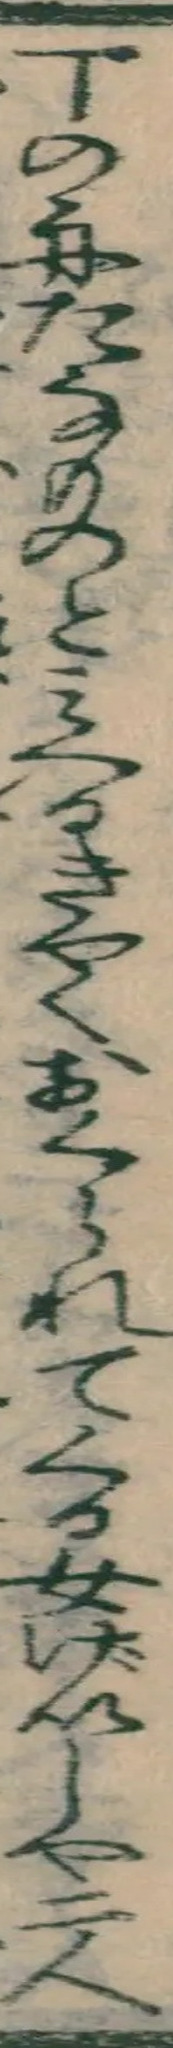丁の舟たなものとみへるきやくおくられてくる女げいしや二人
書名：教訓読本：大礒風俗仕懸文庫
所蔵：国立国会図書館 National Diet Library, JAPAN
